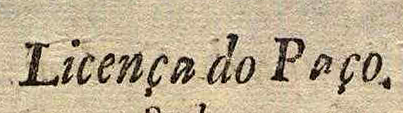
Licença do Paço.
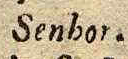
Senhor.
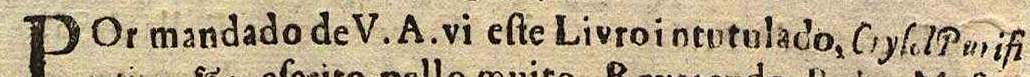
POr mandado de V. A. vi este Livro intitulado, Crysol Purifi
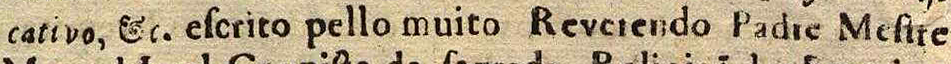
cativo, &c. escrito pello muito Reverendo Padre Mestre
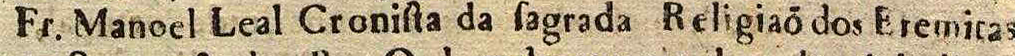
Fr. Manoel Leal Cronista da sagrada Religiaõ dos Eremitas
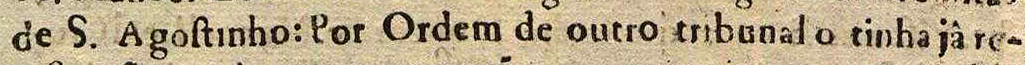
de S. Agostinho: Por Ordem de outro tribunal o tinha jâ re
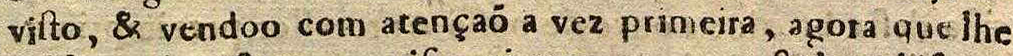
visto, & vendoo com atençaõ a vez primeira, agora que lhe
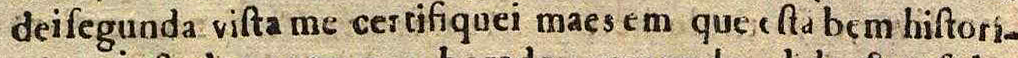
dei segunda vista me certifiquei maes em que esta bem histori
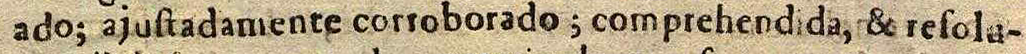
ado; ajustadamente corroborado; comprehendida, & resolu
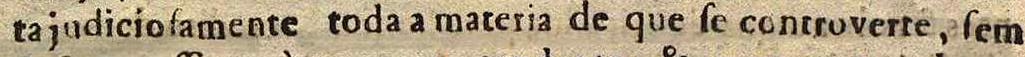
ta judiciosamente toda a materia de que se controverte, sem
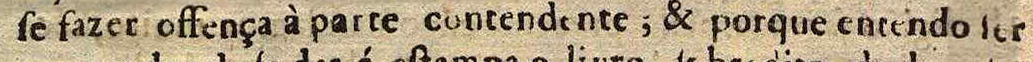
se fazer offença à parte contendente; & porque entendo ser
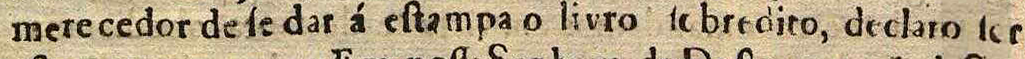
merecedor de se dar á estampa o livro sobredito, declaro ser
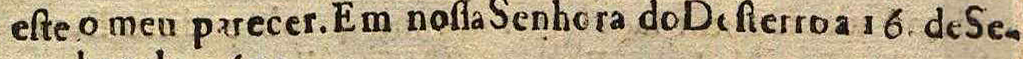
este o meu parecer. Em nossa Senhora do Desterro a 16 de Se
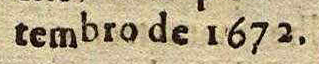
tembro de 1672.
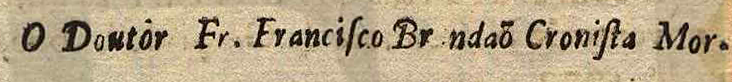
O Doutor Fr. Francisco Br ndaõ Cronista Mor.
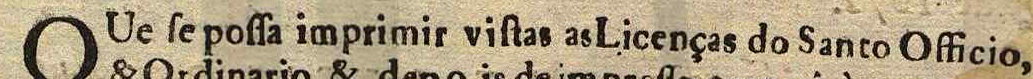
QUe se possa imprimir vistas as Licenças do Santo Officio,
